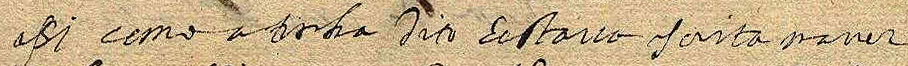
assi como a tinha dito e estaua escrita na ver
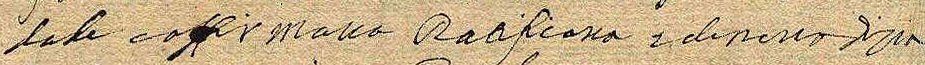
dade e affirmaua Ratificava e de nouo dizia
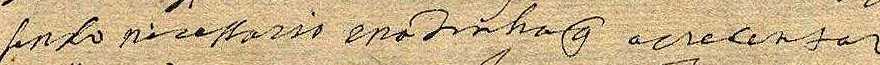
sendo necessario e nã tinha q̄ acrecentar
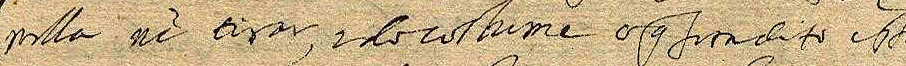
nella nē tirar, e do costume o q̄ fora dito esti
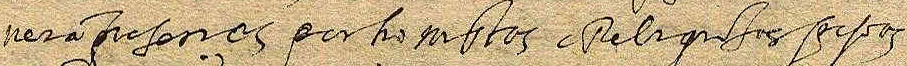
verã presentes per honestas e Religiosas pesoas
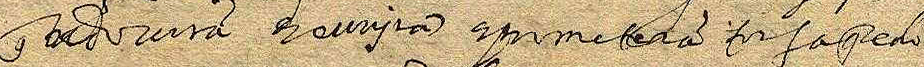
q̄ tudo uirã e ouvjrã E prometerã ter sagredo
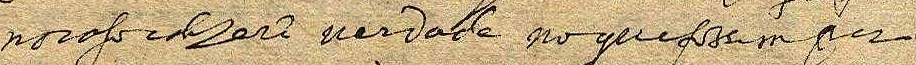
no caso e dizerē uerdade no que fossem per
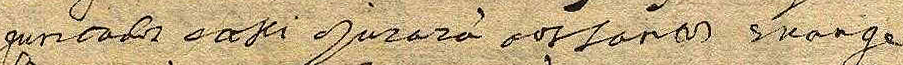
guntados e assi o jurarã aos santos evange
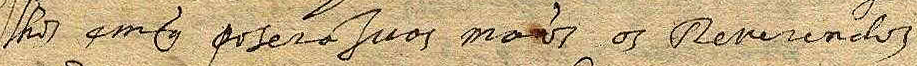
lhos em q̄ poserã suas mãos os Reverendos
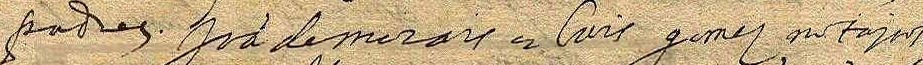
padres. Joã de morais e Luis gomez, notarios
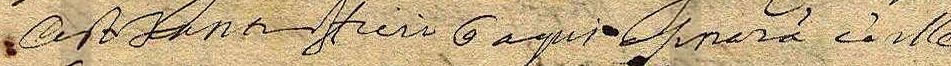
deste Santo officio, q̄ aqui asinarã cō elle
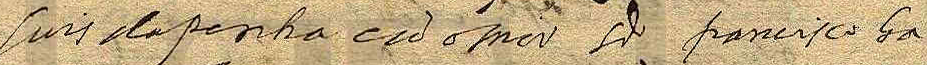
Luis da penha e cō o Snor Ldo francisco ba
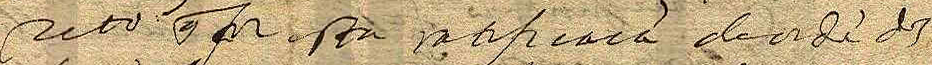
reto q̄ por esta ratificacaõ de ordē dos
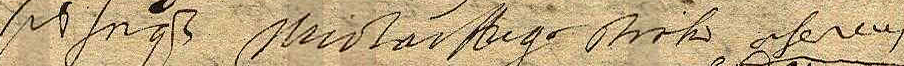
Srs̄ Jnq̄s Nicolau Augostinho o escrevj
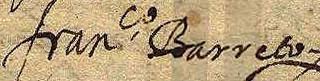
fran.co Barreto
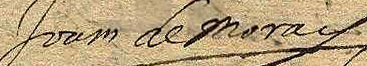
Joam de Morais
